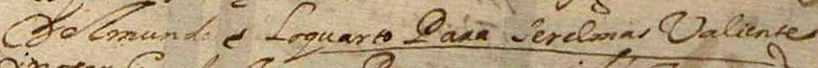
Del mundo. Lo quarto Para ser el mas Valiente
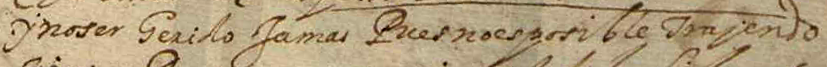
y no ser herido Jamas Pues no es posible Trajendo
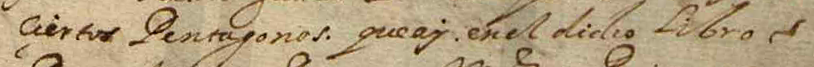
ciertos Pentagonos. que ay en el dicho libro.
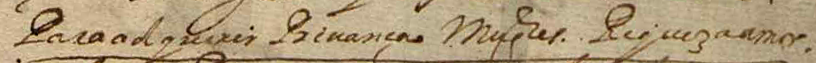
Para adquirir Priuança Mugeres Riqueza amor.
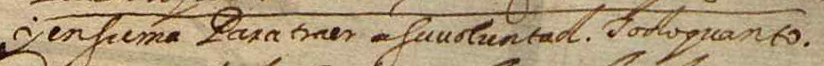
y en suma Para traer a su uoluntad. Todo quanto.
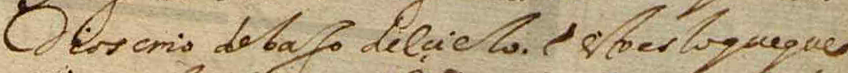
Dios crio debaJo del cielo. esto es lo que que
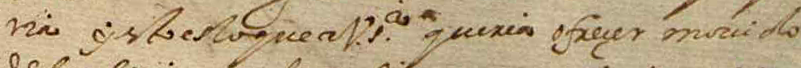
ria y esto es lo que a V s.a queria ofrecer mouido
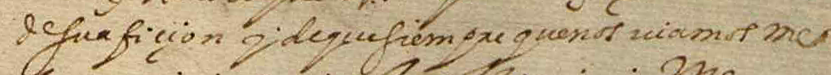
de su aficion y de que siempre que nos uiamos me
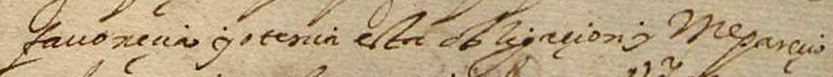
fauorecia y o tenia esta obligacion y Me parecio
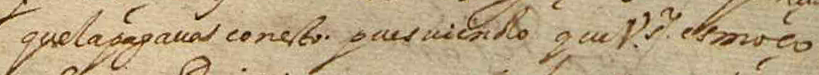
que la pagaua con esto. pues uiendo que V. s.a es moço
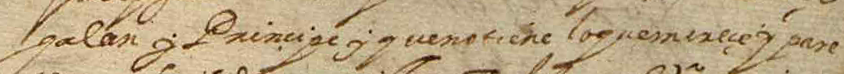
galan y Principe y que no tiene lo que merece y pare
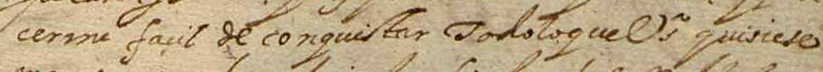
cerme facil de conquistar Todo lo que Vsa quisiese
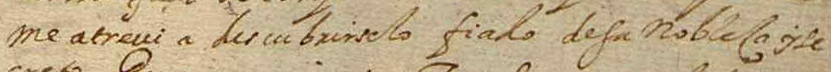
me atreui a descubrirselo fiado de su nobleza y se
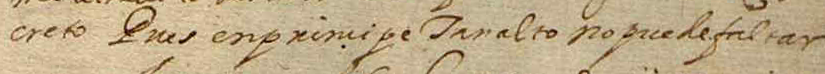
creto Pues en principe Tan alto no puede faltar
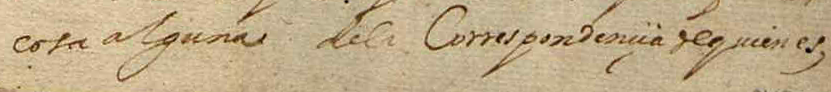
cosa alguna de la Correspondencia de quien es,
